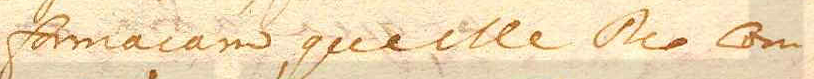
formaçam, que elle Reo com
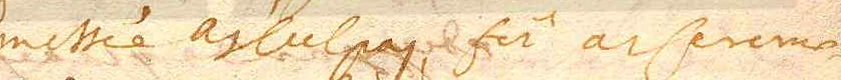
mettce as Culpas, fêz as Ceremo
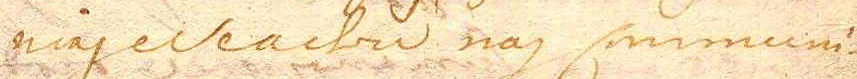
nias e Se achou nas Communi
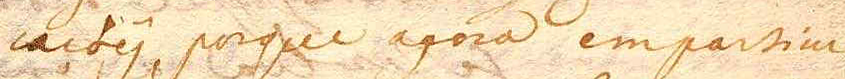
cações, porque agora em particu
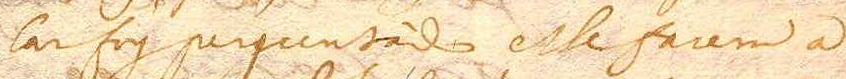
lar foy perguntádo e lhe fazem a
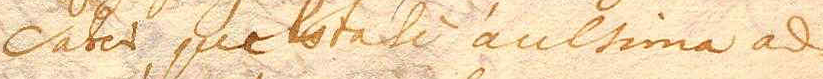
saber, que Esta hé a ultima ad
